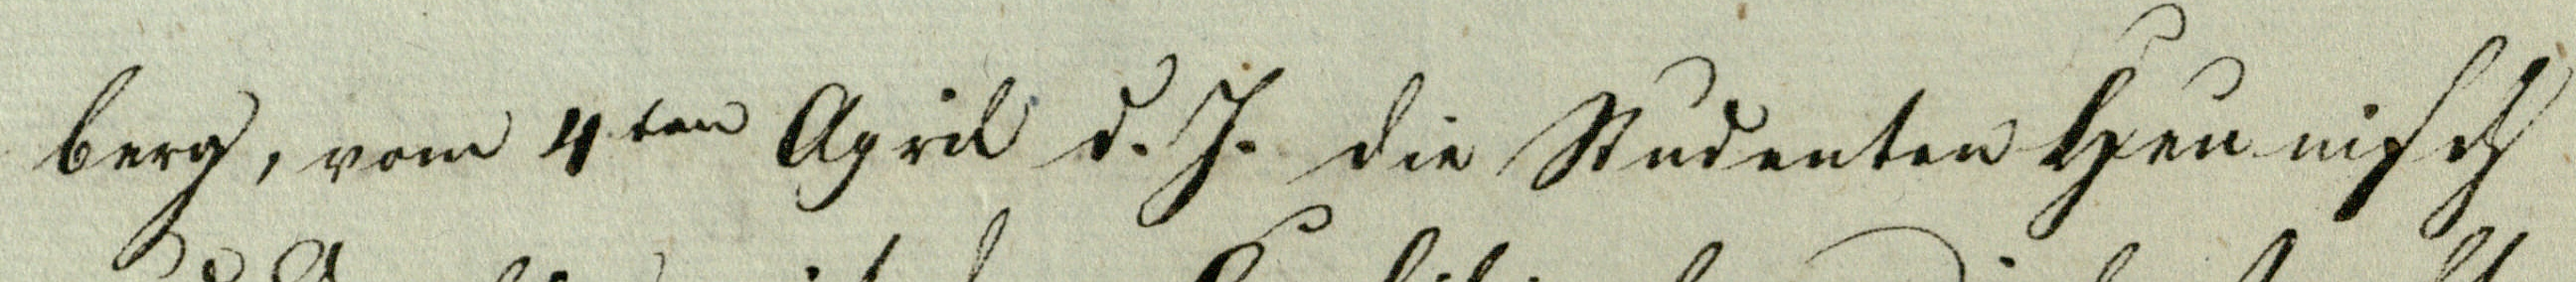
berg, vom 4ten April d. J. die Studenten Heunisch
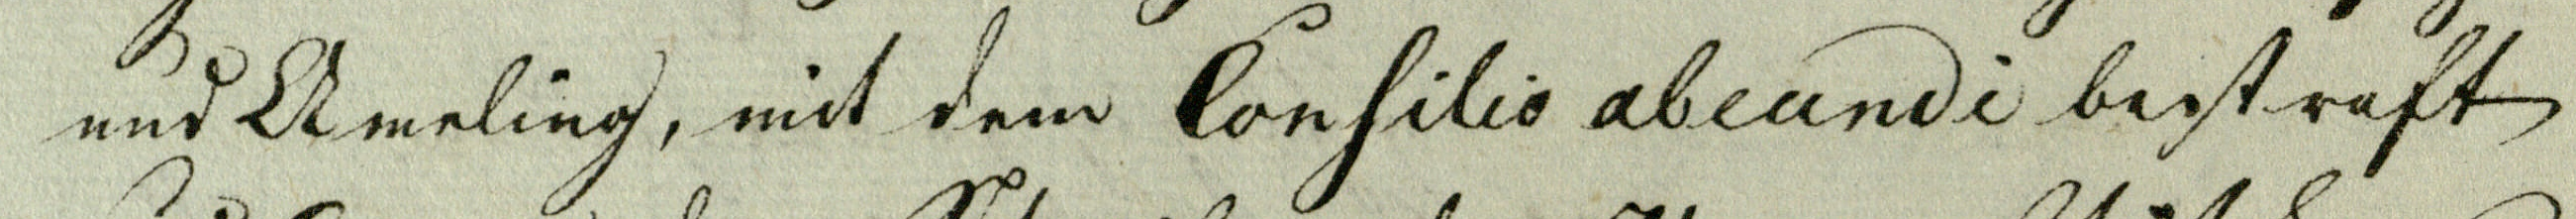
und Ameling, mit dem Consilio abeundi bestraft
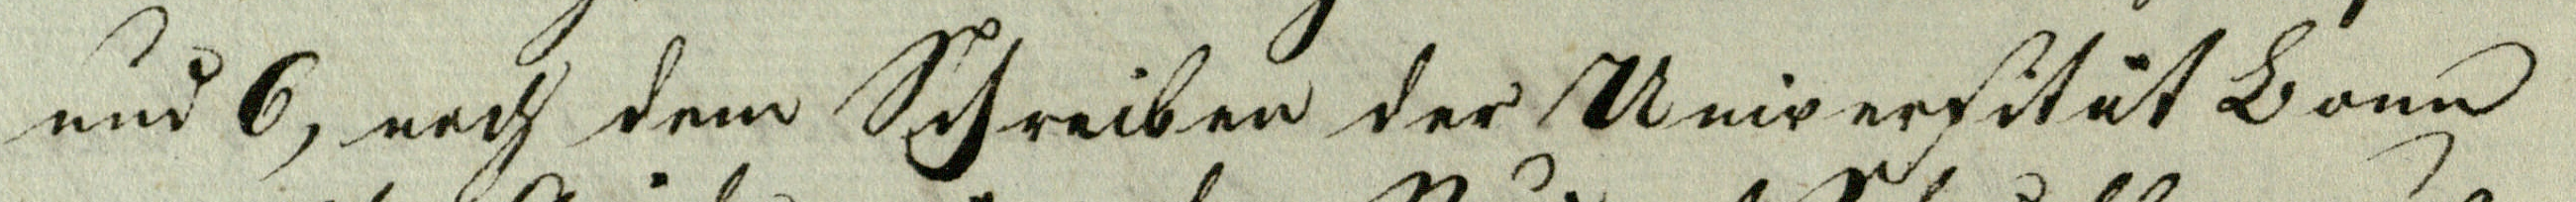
und 6, nach dem Schreiben der Universität Bonn
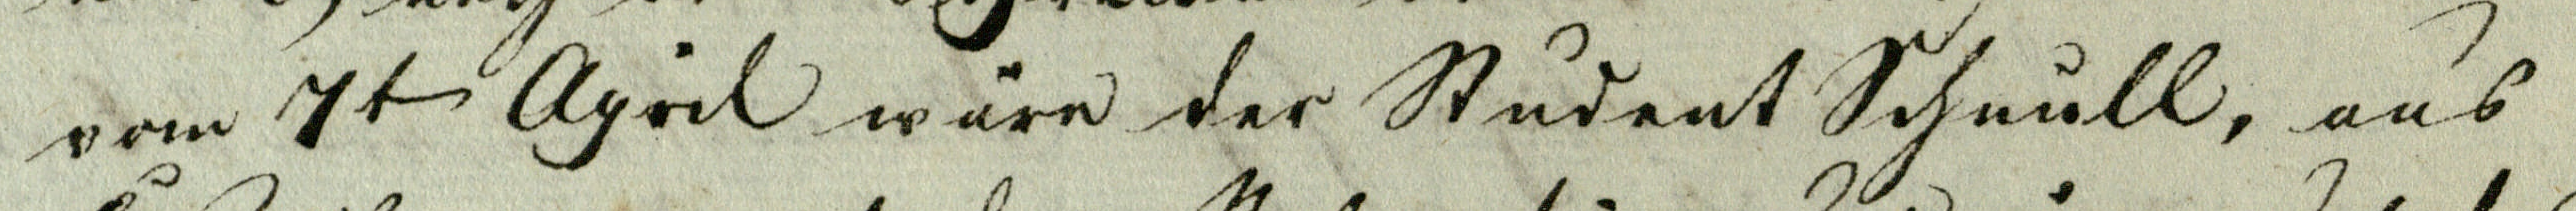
vom 7ten April wäre der Student Schnull, aus
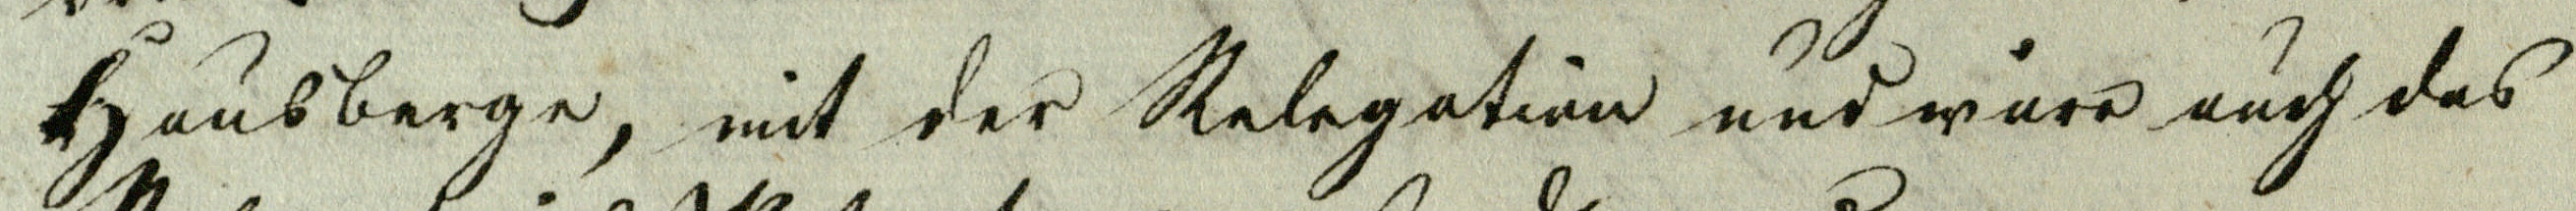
Hausberge, mit der Relegation und wäre auch das
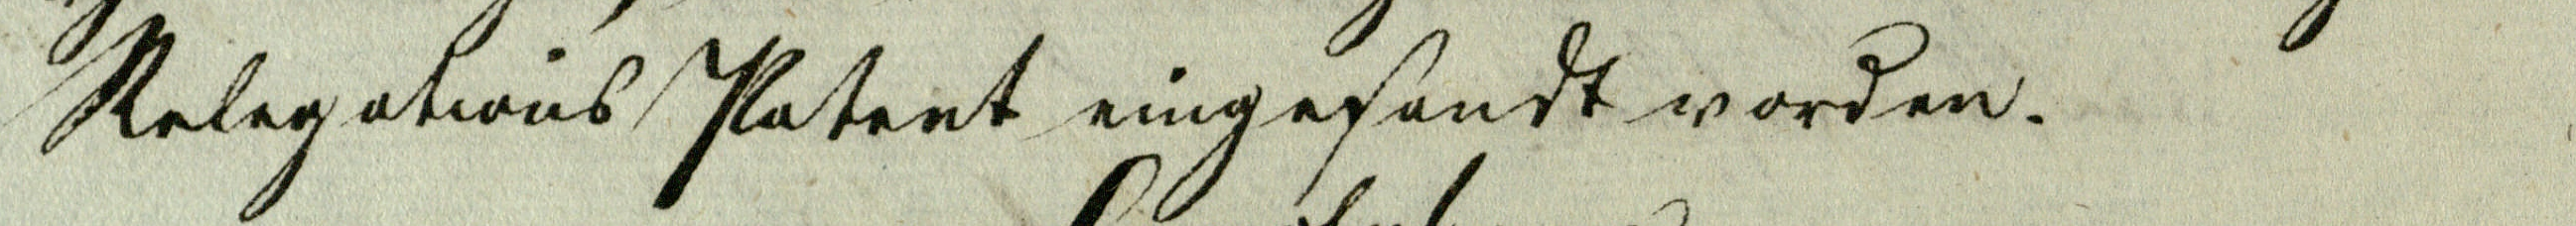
Relegations Patent eingesandt worden.
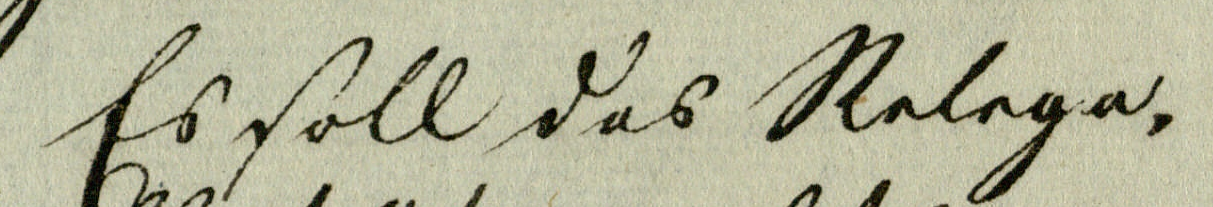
Es soll das Relega¬
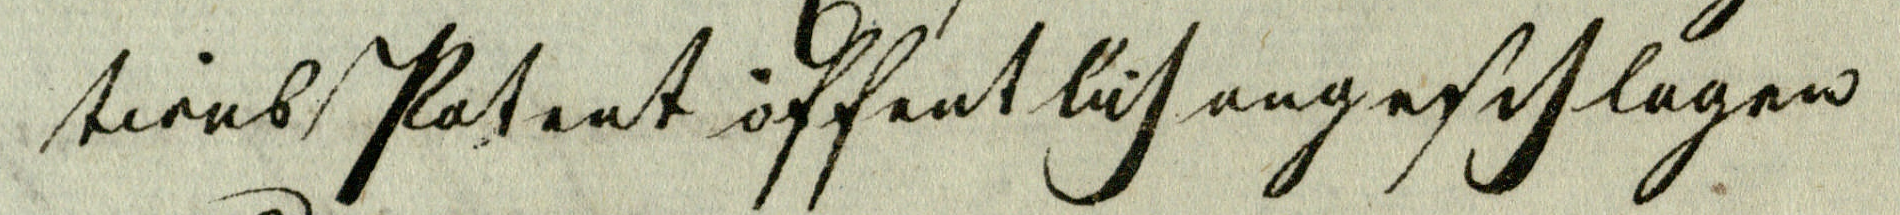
tionsPatent öffentlich angeschlagen
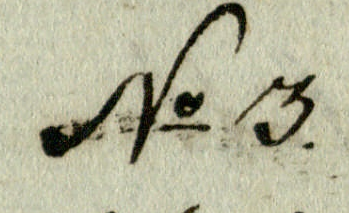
Nº 3.
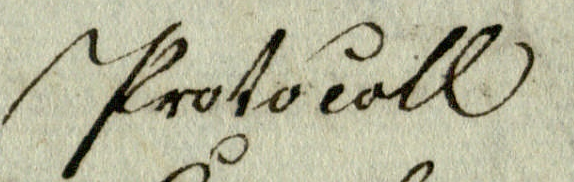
Protocoll
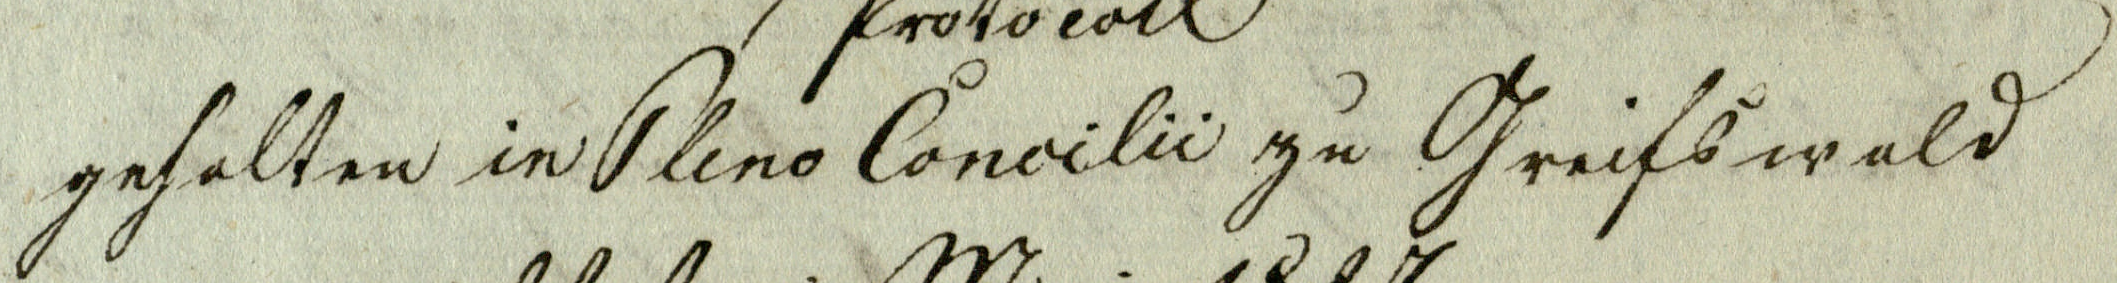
gehalten in Pleno Concilii zu Greifswald
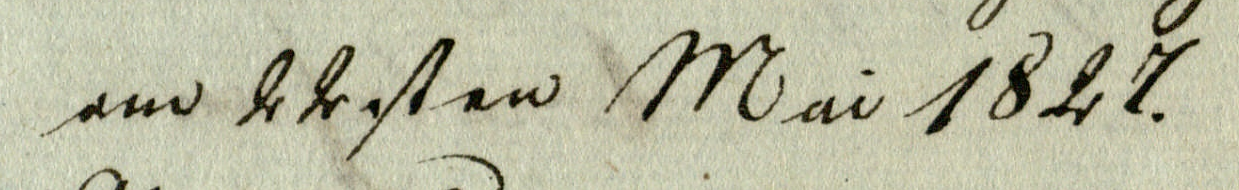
am 22sten Mai 1827.
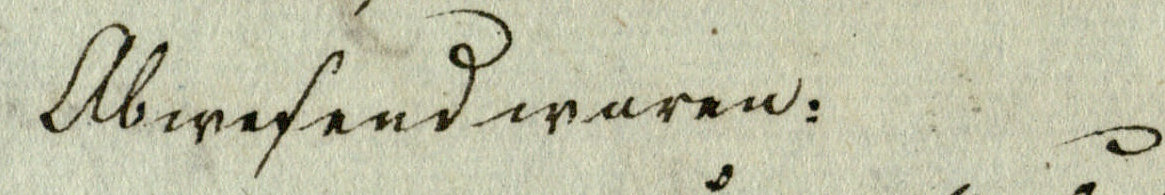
Abwesend waren:
